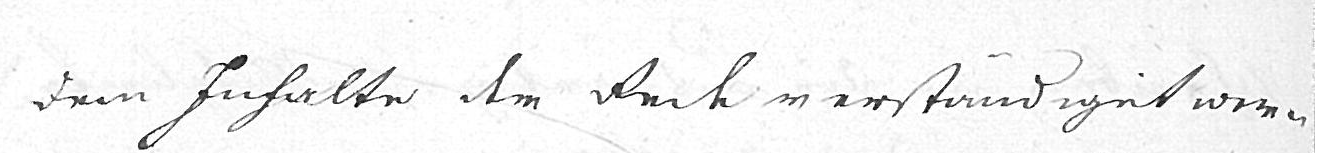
dem Inhalte der Rede verständiget wer-
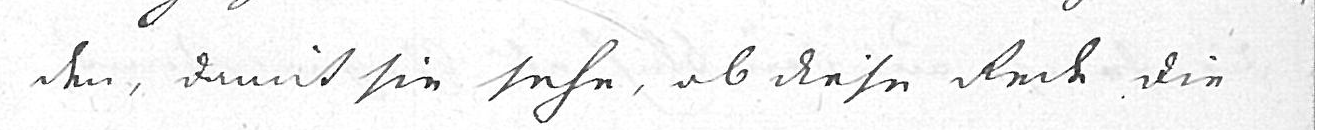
den, damit siesehe, ob diese Rede die
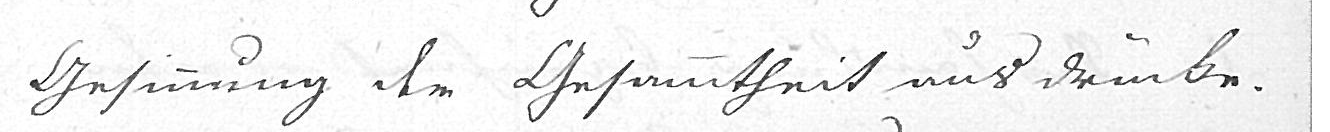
Gesinnung der Gesammtheit ausdrücke.
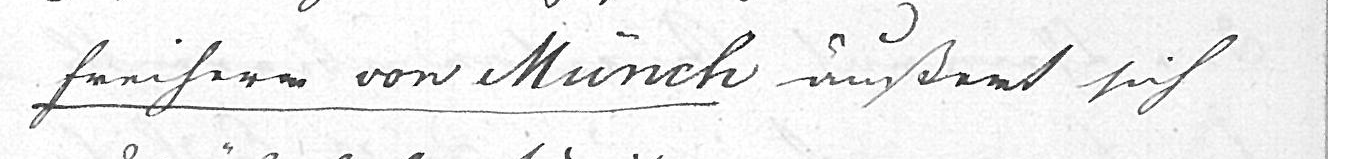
Freiherr von Münch äußert sich
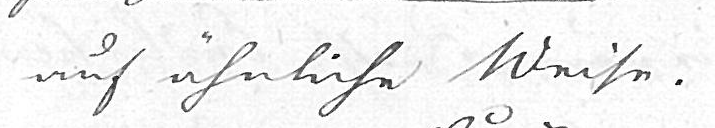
auf ähnliche Weise
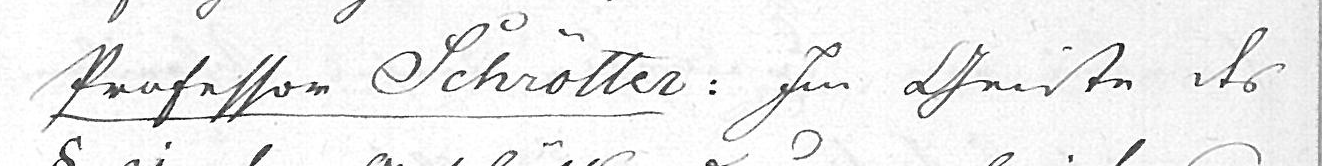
Professor SchrötteR: Im Geiste des
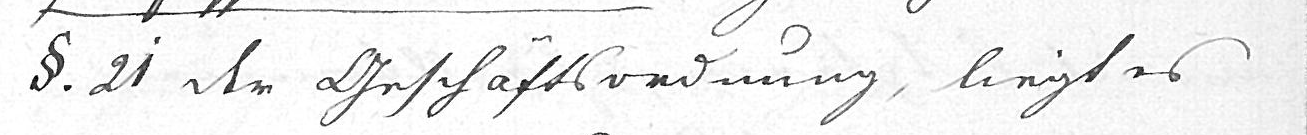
§. 21 der Geschäftsordnung liegt es
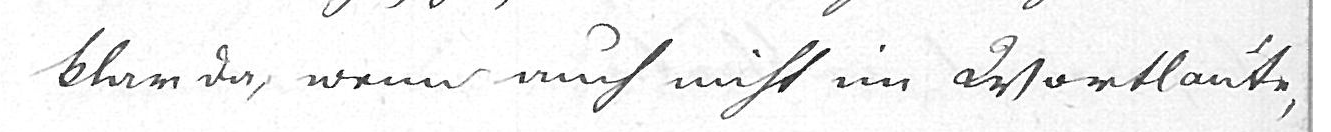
klar da, wenn auch nicht im Wortlaute,
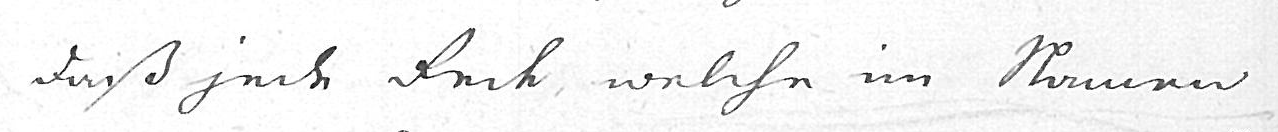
daß jede Rede, welche im Namen
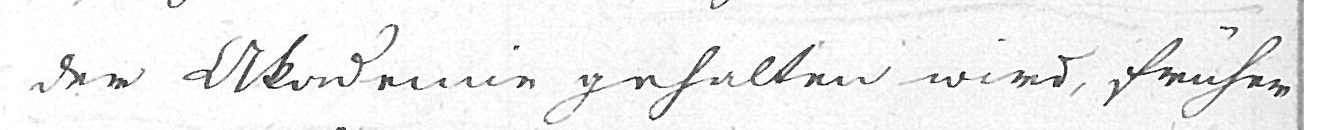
der Akademie gehalten wird, früher
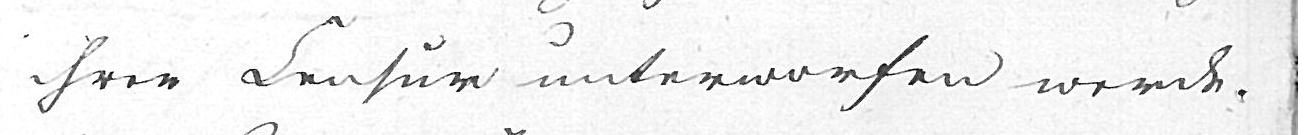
ihrer Censur unterworfen werde,
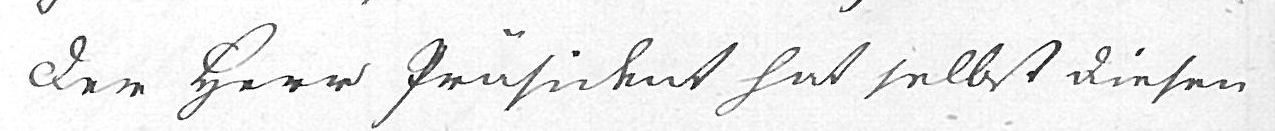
Der Herr Präsident hat selbst diesen
